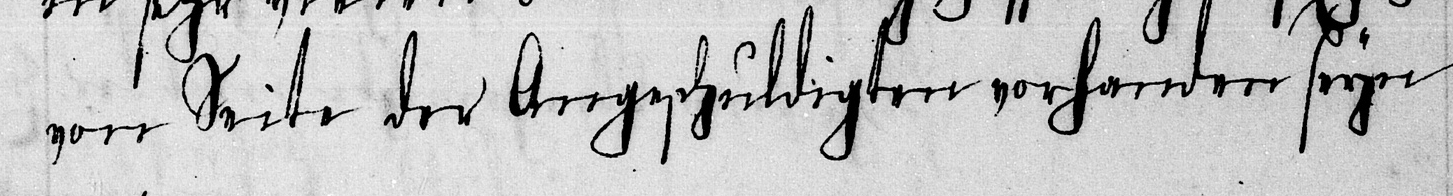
von Seite der Angeschuldigten vorhanden seyn
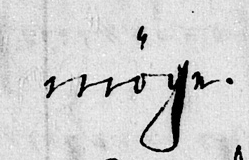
möge.
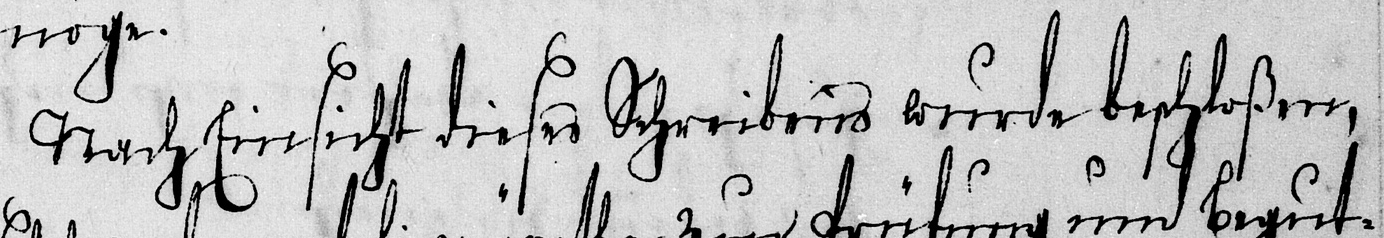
Nach Einsicht dieses Schreibens wurde beschloßen,
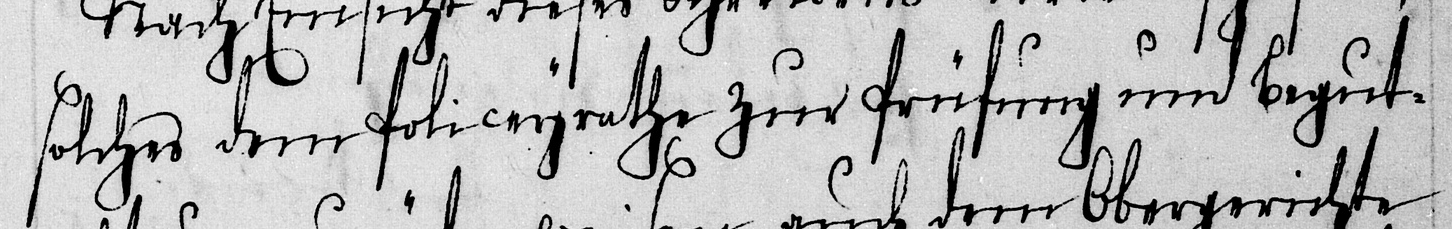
solches dem Policeyrathe zur Prüfung und Begut¬
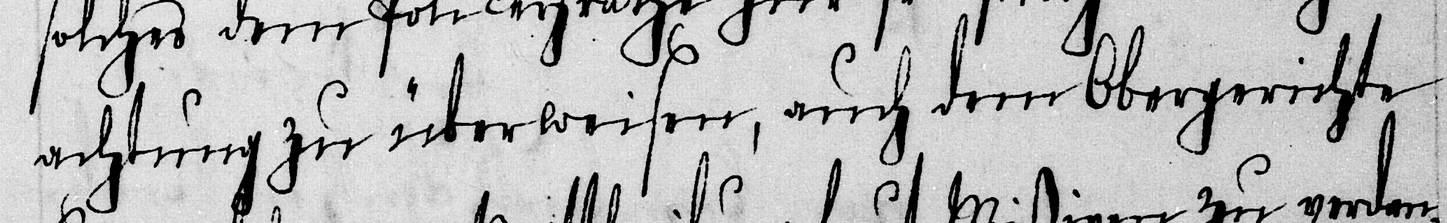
achtung zu überweisen, auch dem Obergerichte
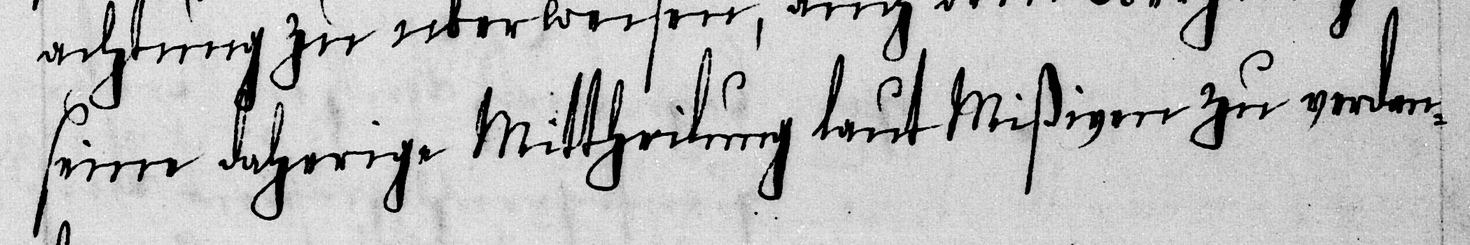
seine daherige Mittheilung laut Mißiven zu verdan¬
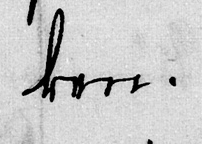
ken.
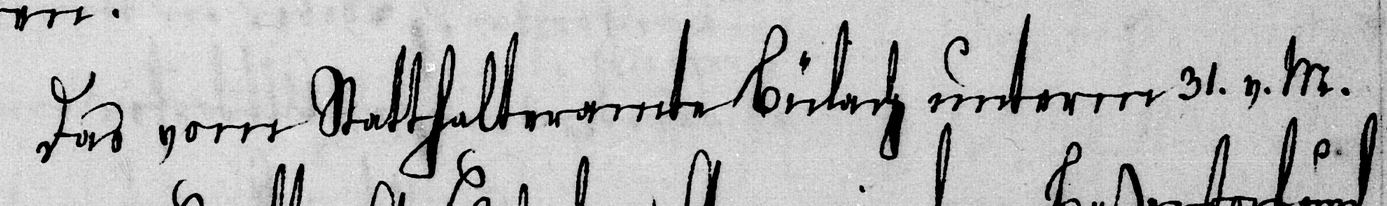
Das vom Statthalteramte Bülach unterm 31. v. M.
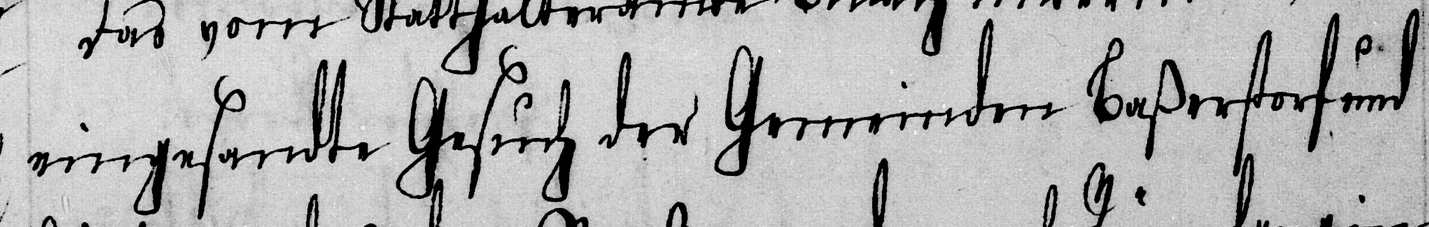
eingesandte Gesuch der Gemeinden Baßerstorf und
